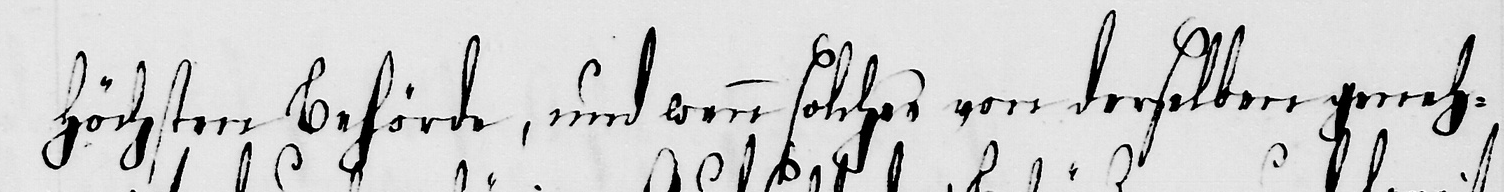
Höchsten Behörde, und wenn solches von derselben geneh¬
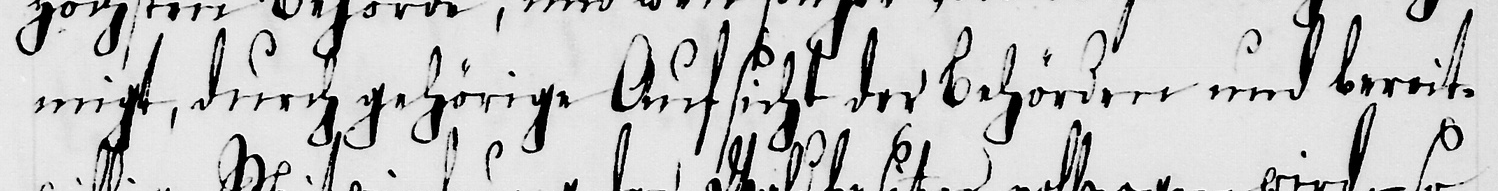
migt, durch gehörige Aufsicht der Behörden und bereit¬
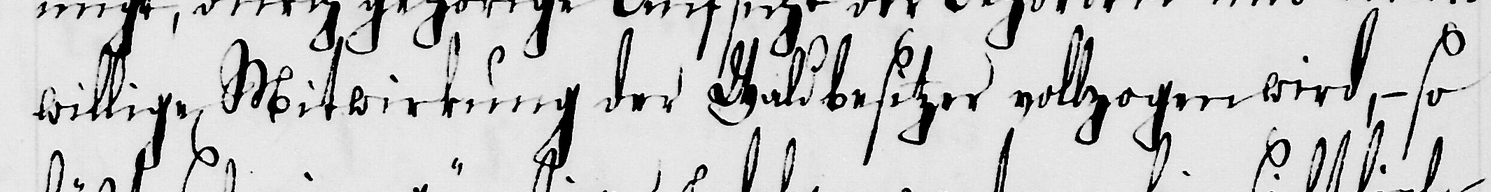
willige Mitwirkung der Waldbesitzer vollzogen wird, – so
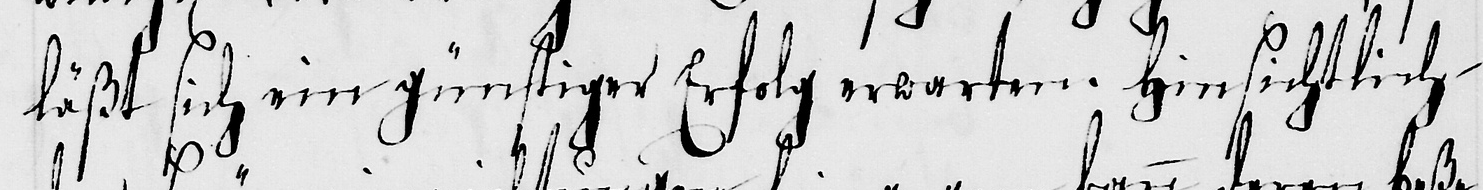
läßt sich ein günstiger Erfolg erwarten. Hinsichtlich
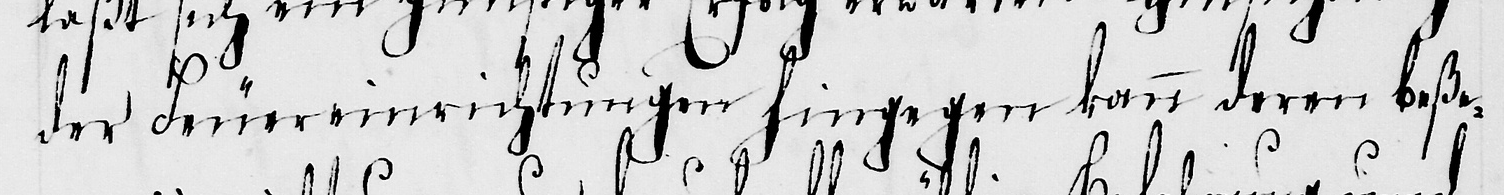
der Feuereinrichtungen hingegen kann deren beße¬
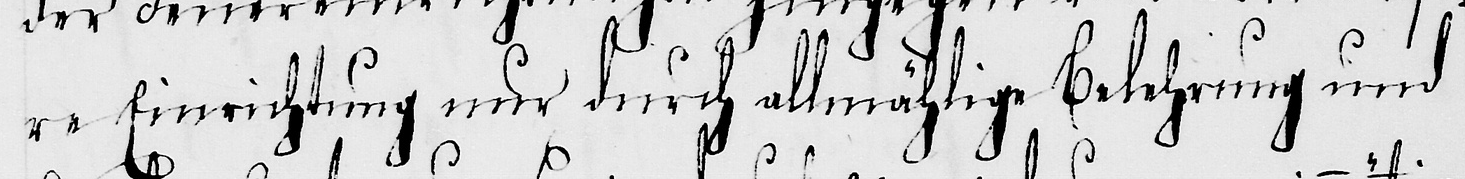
re Einrichtung nur durch allmählige Belehrung und
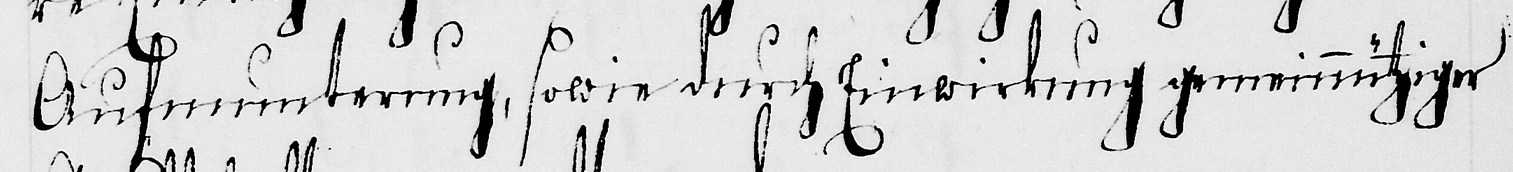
Aufmunterung, sowie durch Einwirkung gemeinnütziger
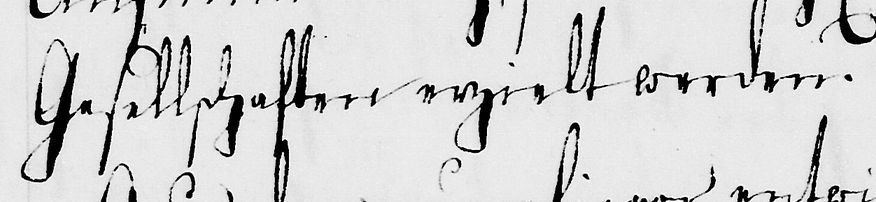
Gesellschaften erzielt werden.
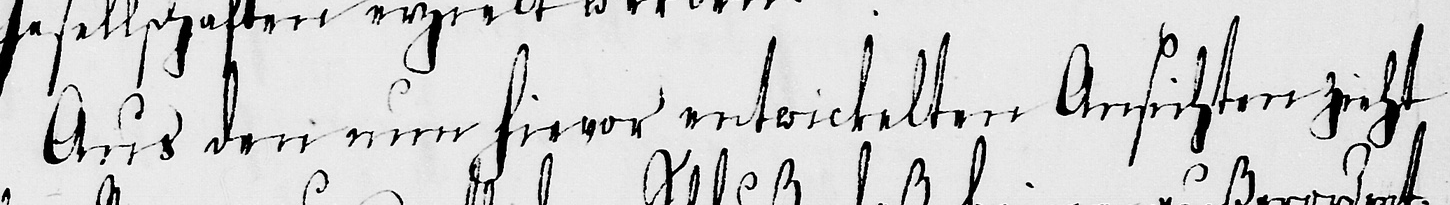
Aus den nun hievor entwickelten Ansichten zieht
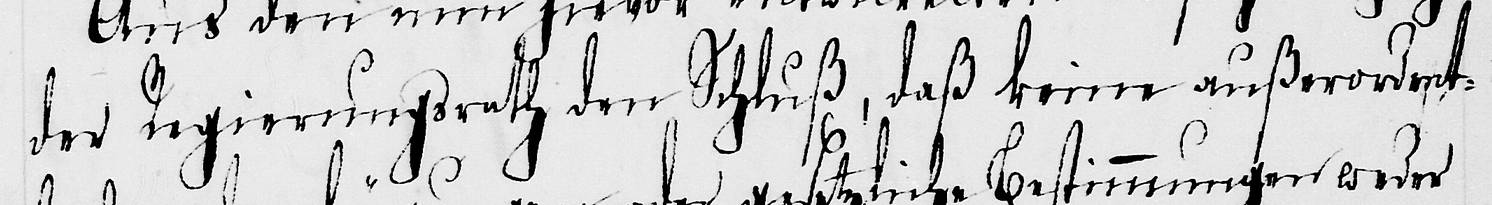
der Regierungsrath den Schluß, daß keine außerordent¬
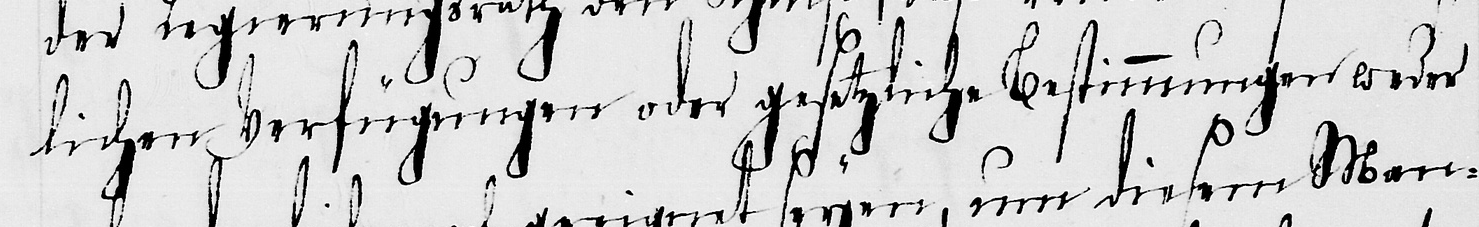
lichen Verfügungen oder gesetzliche Bestimmungen weder
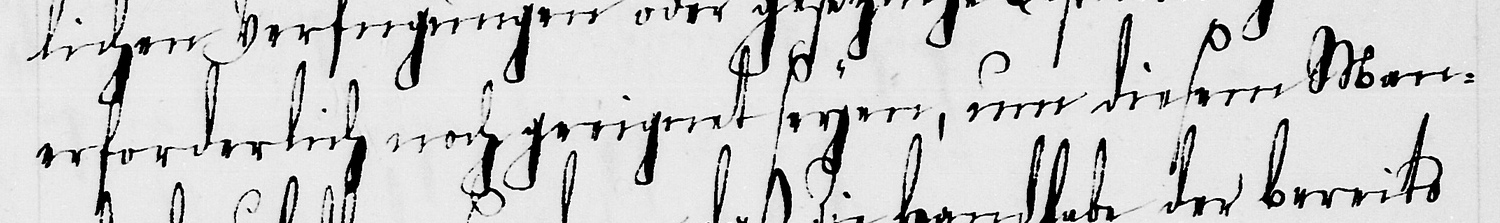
erforderlich noch geeignet seyen, um diesem Man¬
